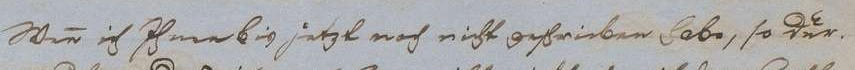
Wenn ich Ihnen bis jetzt noch nicht geschrieben habe, so dür-
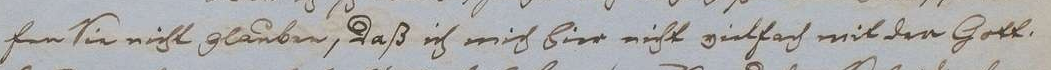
fen Sie nicht glauben, daß ich mich hier nicht vielfach mit der Gott-
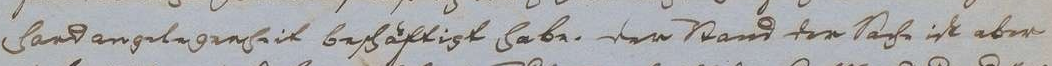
hardangelegenheit beschäftigt habe. Der Stand der Sache ist aber
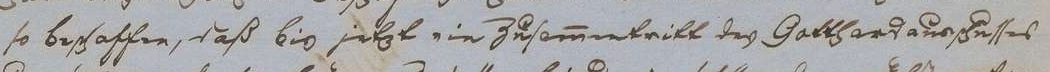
so beschaffen, daß bis jetzt ein Zusammentritt des Gotthardausschusses
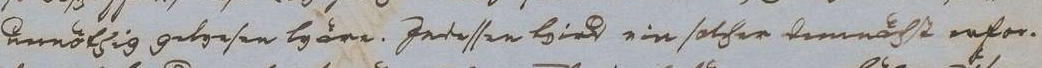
unnöthig gewesen wäre. Indessen wird ein solcher demnächst erfor-
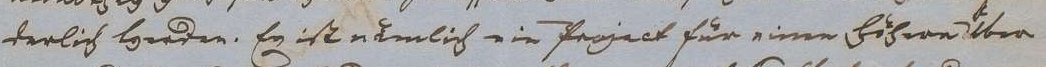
derlich werden. Es ist nämlich ein Project für einen höhern Über-
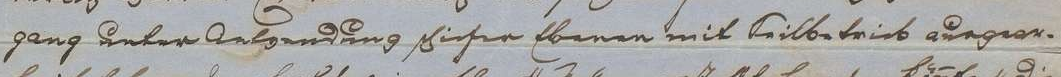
gang unter Anwendung schiefer Ebenen mit Seilbetrieb ausgear-
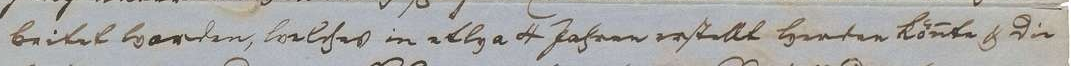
beitet werden, welches in etwa 4 Jahre erstellt werden könnte & die
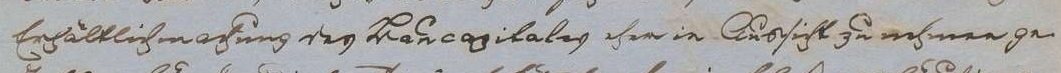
Erhältlichmachung des Baucapitales eher in Aussicht zu nehmen ge-
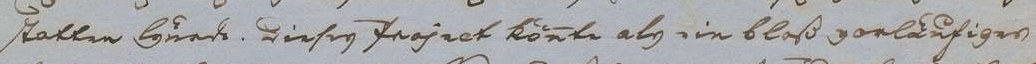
statten würde. Dieses Project könnte als ein bloß vorläufiges
